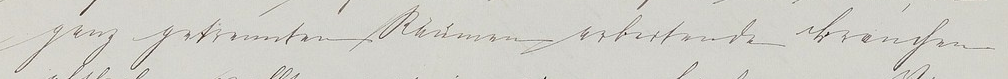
ganz getrennten Räumen arbeitende Branchen
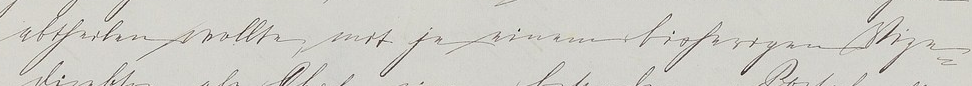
abtheilen wollte, mit je einem bisherigen Vize-
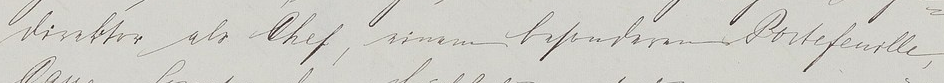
Direktor als Chef, einem besonderen Portefeuille,
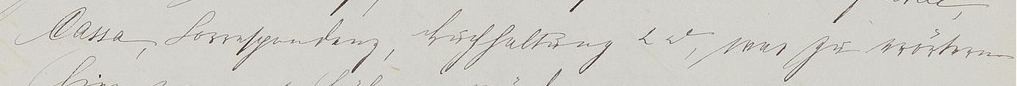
Cassa, Correspondenz, Buchhaltung &ct, was zu erörtern
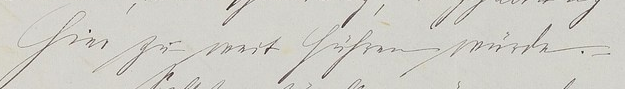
hier zu weit führen würde. –
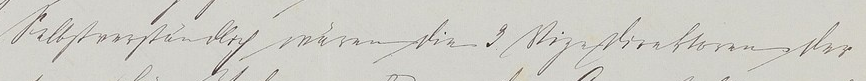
Selbstverständlich wären die 3 Vize Direktoren der
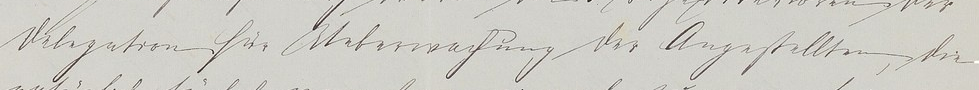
Delegation für Ueberwachung der Angestellten, die
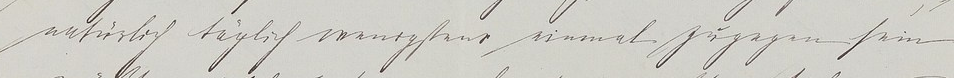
natürlich täglich wenigstens einmal zugegen sein
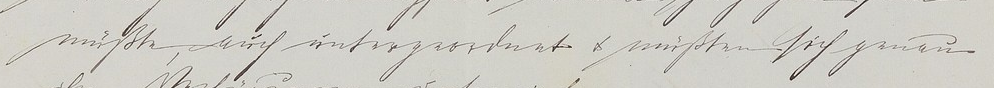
müßte, auch untergeordnet & müßten sich genau
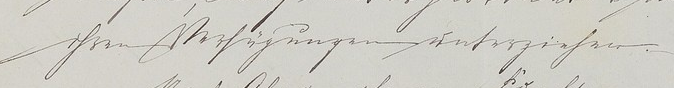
ihren Verfügungen unterziehen. –
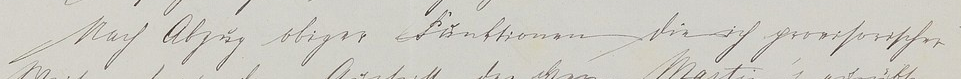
Nach Abzug obiger Funktionen die ich provisorischer
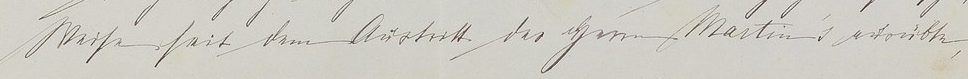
Weise seit dem Austritt des Herrn Martin's ausübte,
